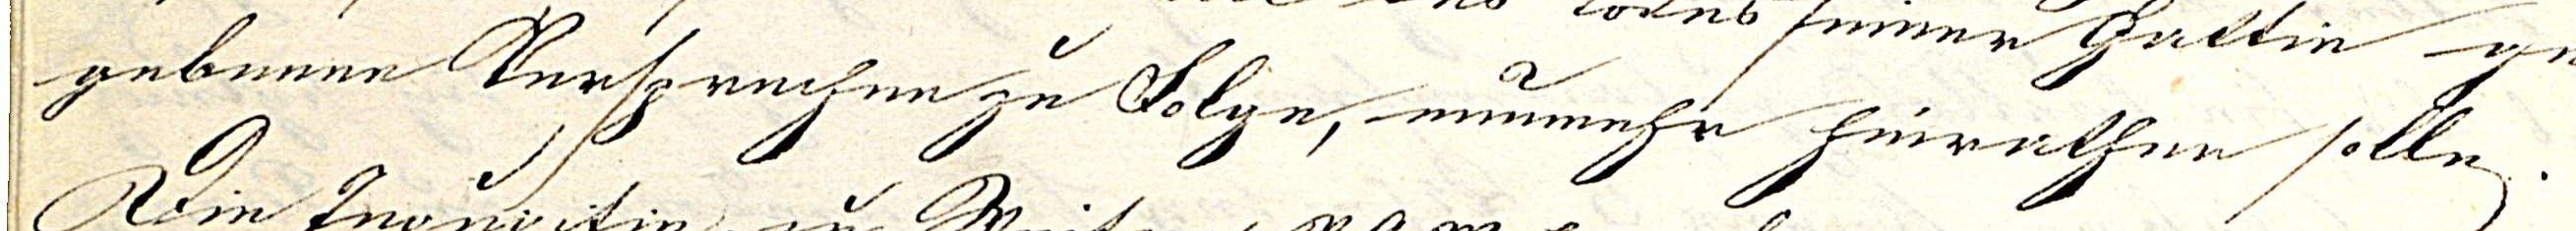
gebenen Versprechen zu Folge, nunmehr hinrathen solle.
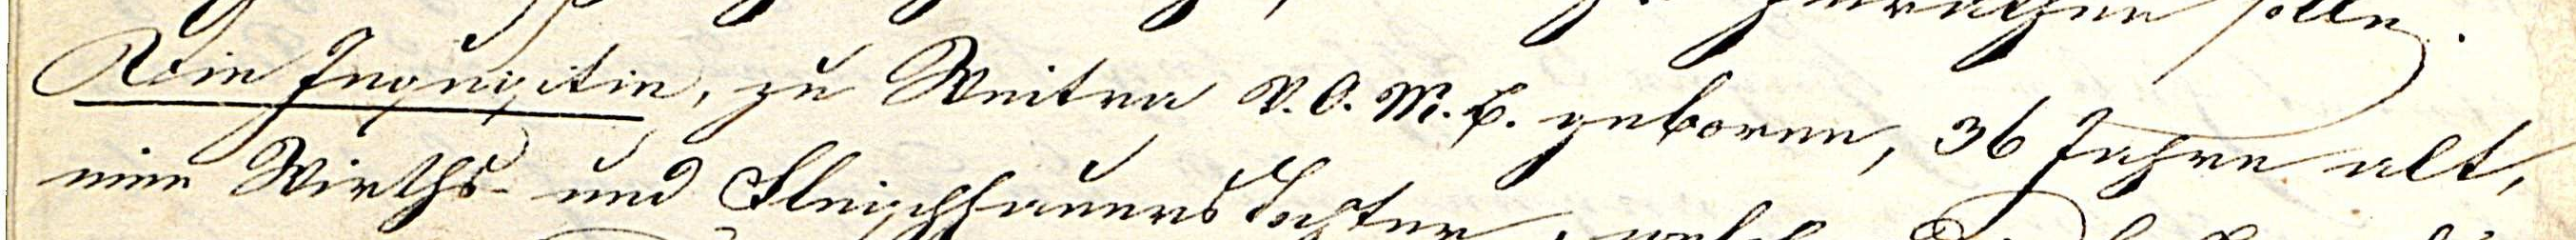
Die Jnquisitin, zu Weitra V. O. M. B. geboren, 36 Jahre alt,
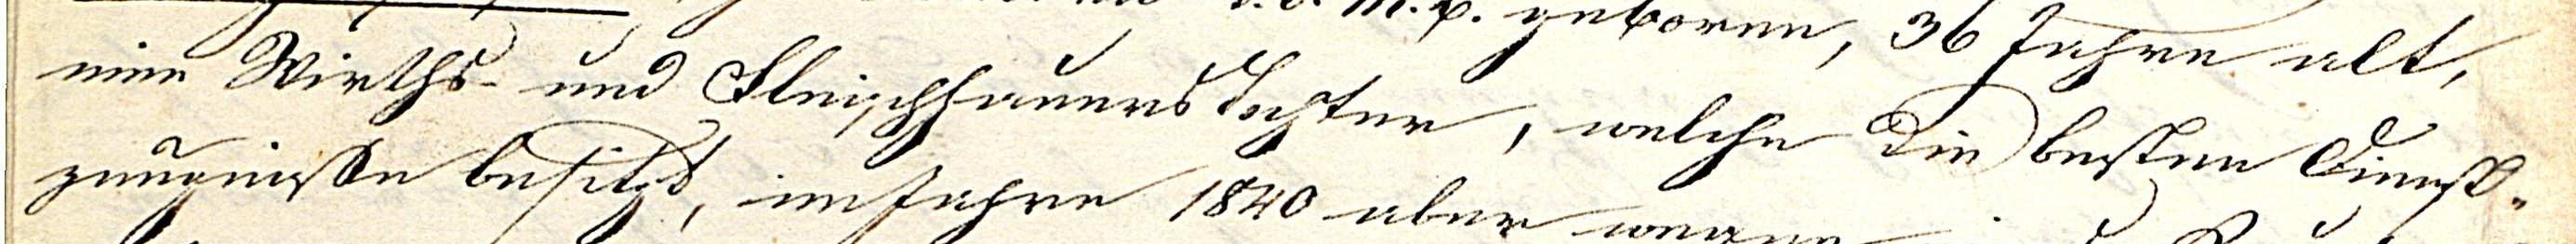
eine Wirths- und Fleischhauers Tochter, welche die besten Dienst¬
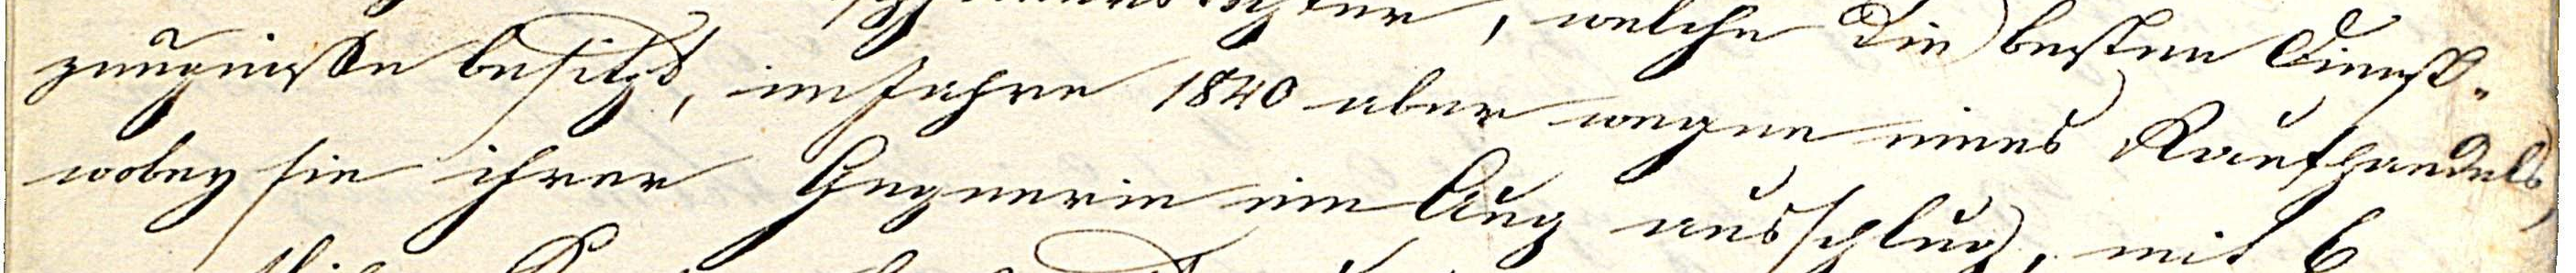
zeugniße besitzt, im Jahre 1840 aber wegen eines Kaufhandels,
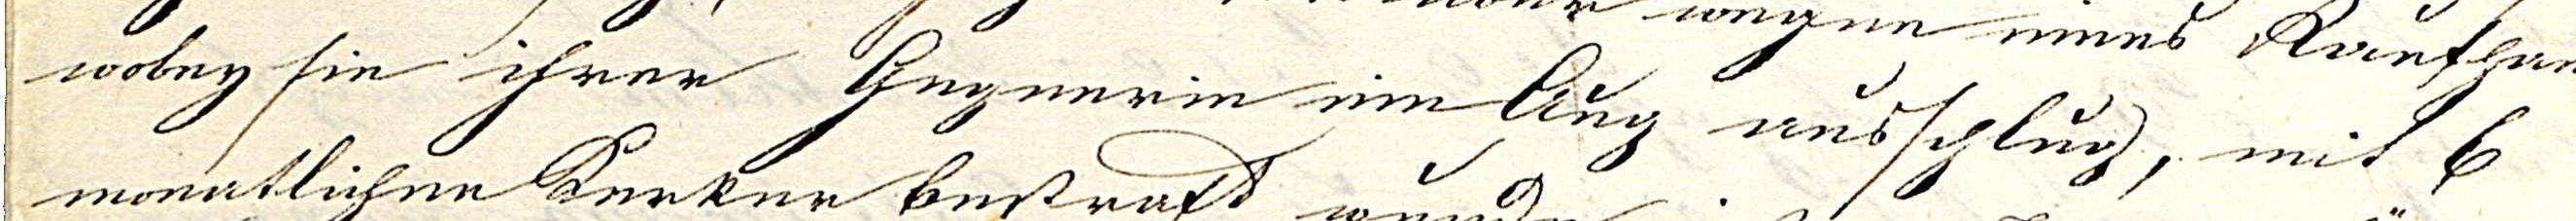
wobey sie ihrer Gegnerin ein Aug ausschlug, mit xx
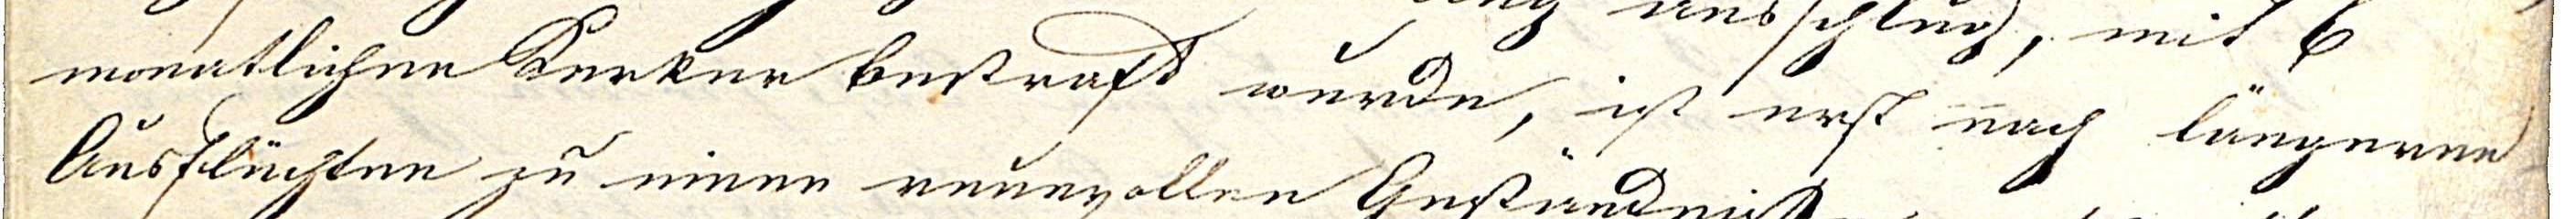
monatlichen Kerker bestraft wurde, ist erst nach längeren
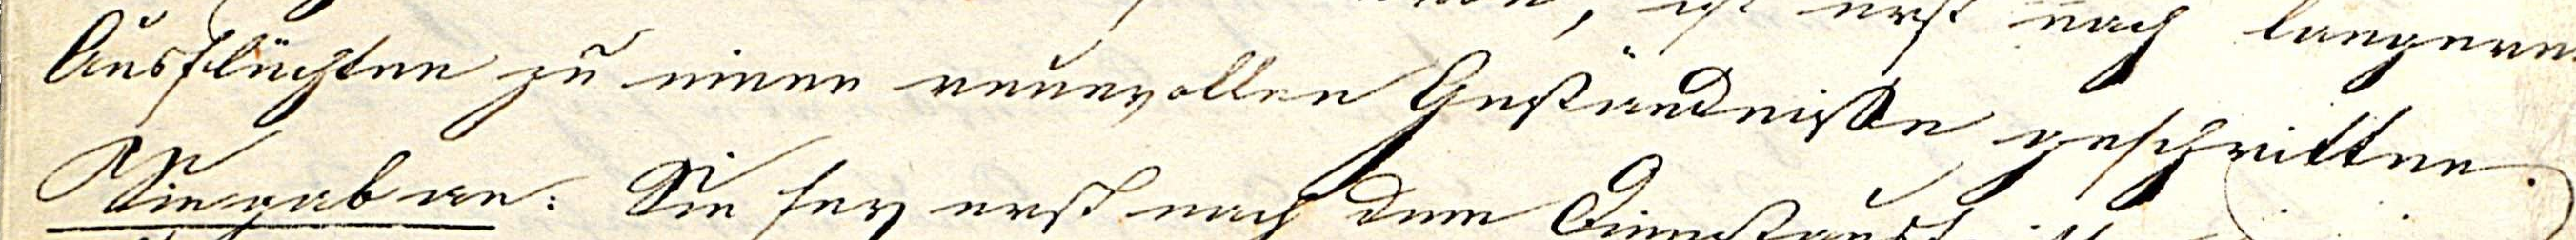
Ausflüchten zu einen reuevollen Geständniße geschritten.
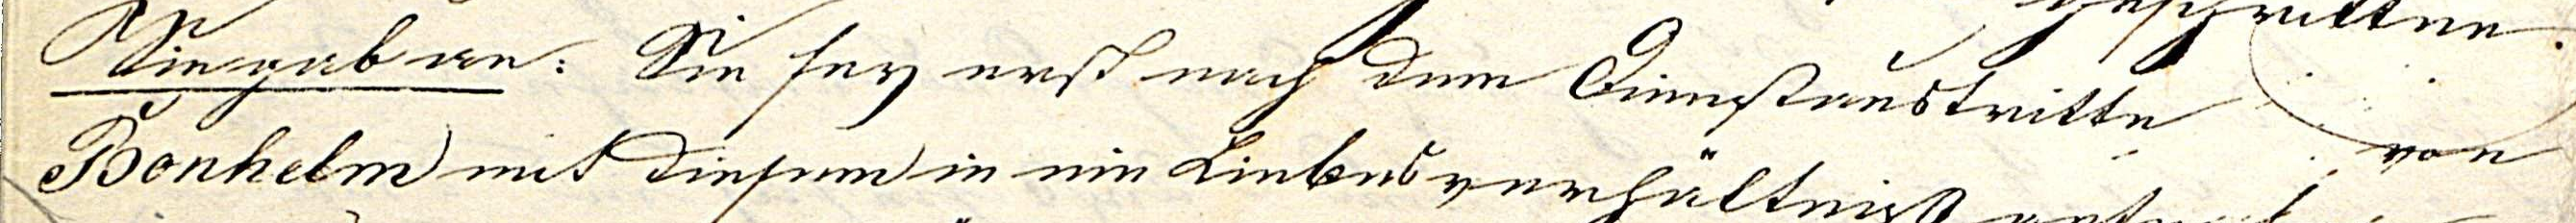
Sie gab an: Sie sey erst nach dem Dienstaustritte von
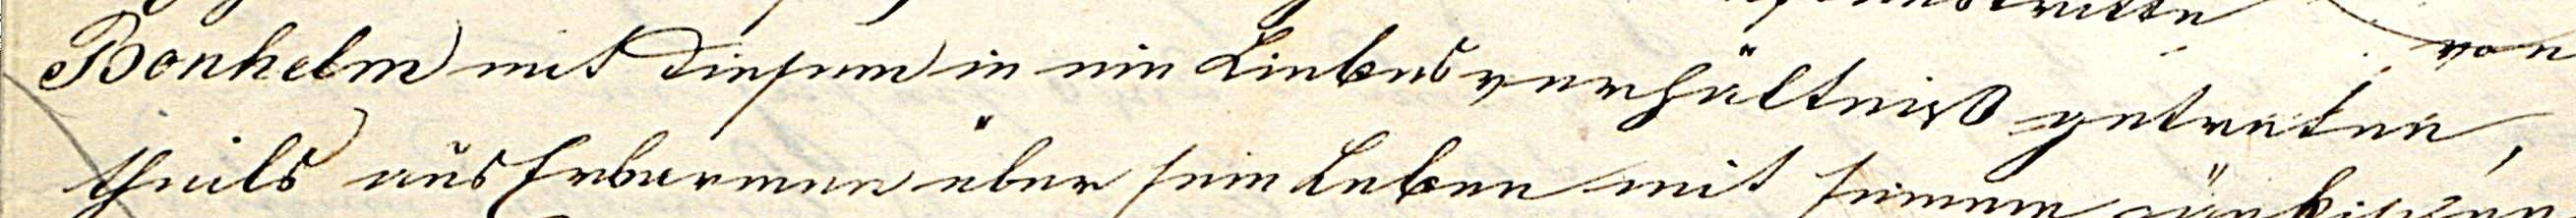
Bonhelm mit diesem in ein Liebesverhältniß getreten,
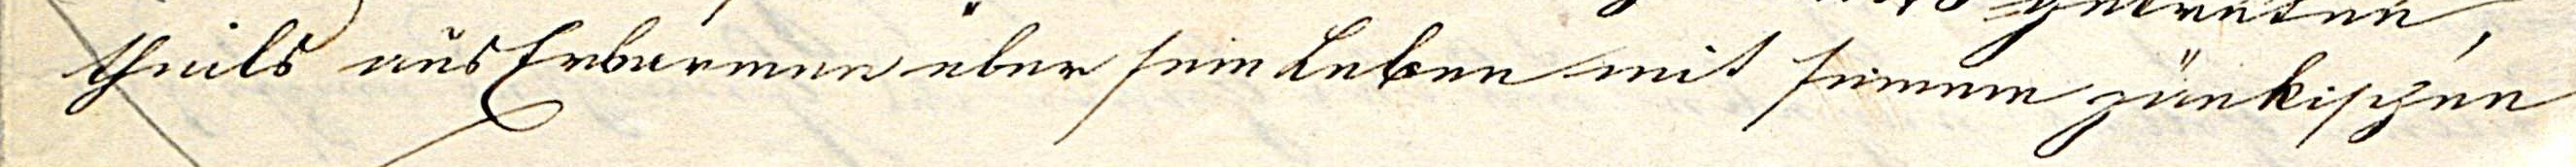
theils aus Erbarmen über sein Leben mit seinem zänkischen
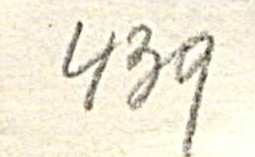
439
